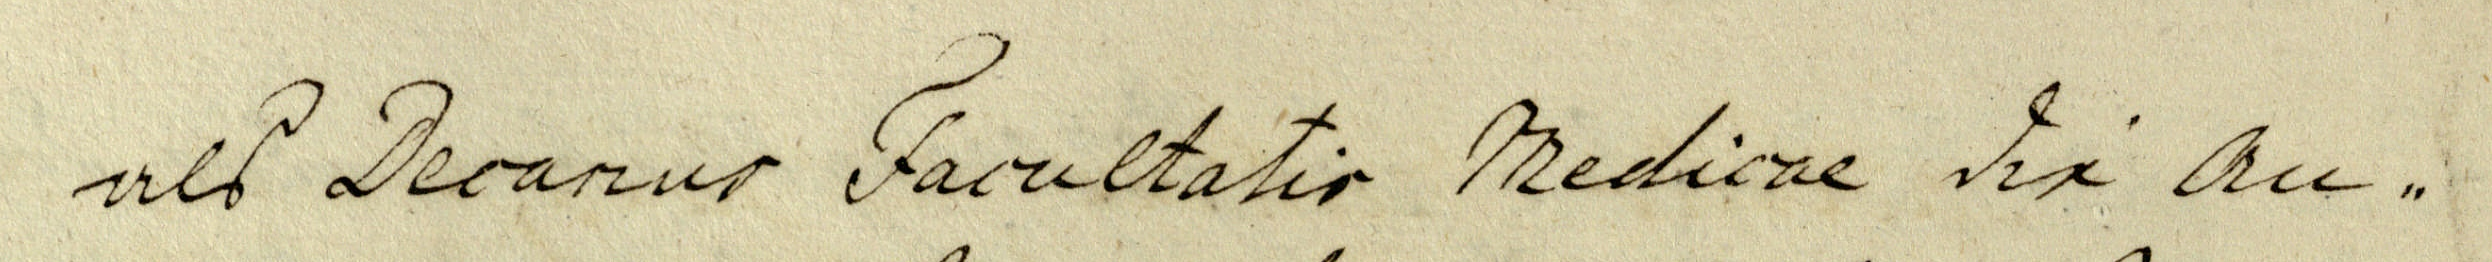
als Decanus Facultatis Medicae die An¬
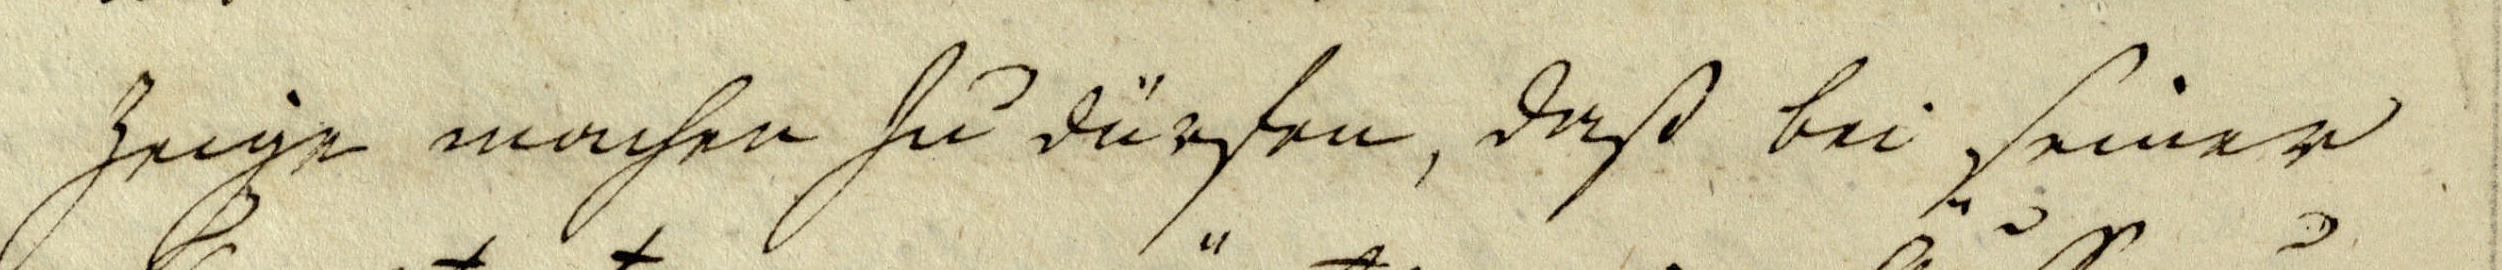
zeige machen zu dürfen, daß bei seiner
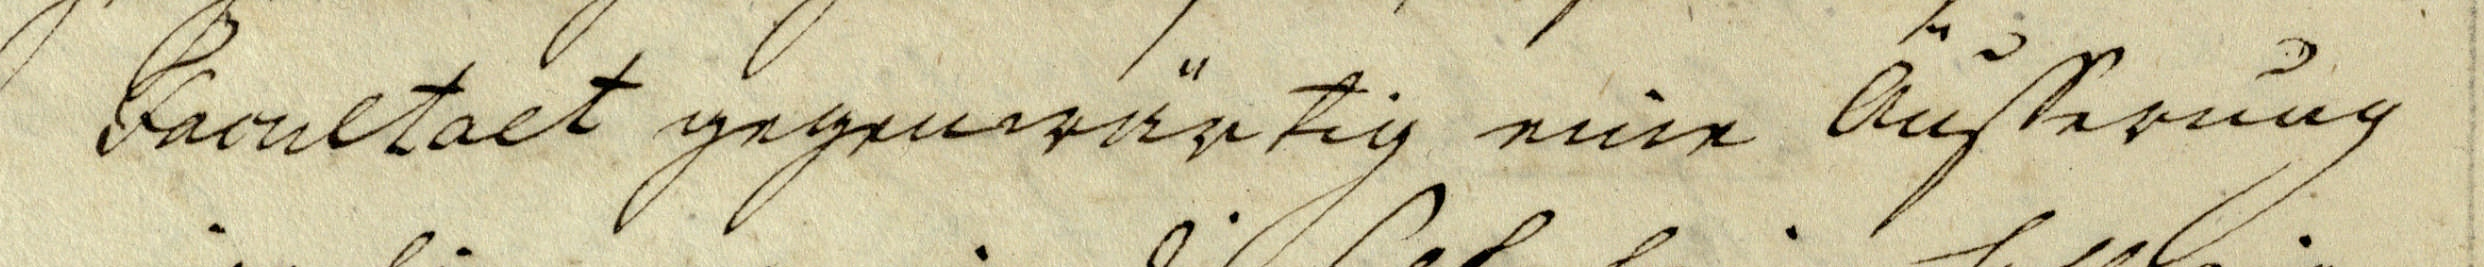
Facultaet gegenwärtig eine Äusserung
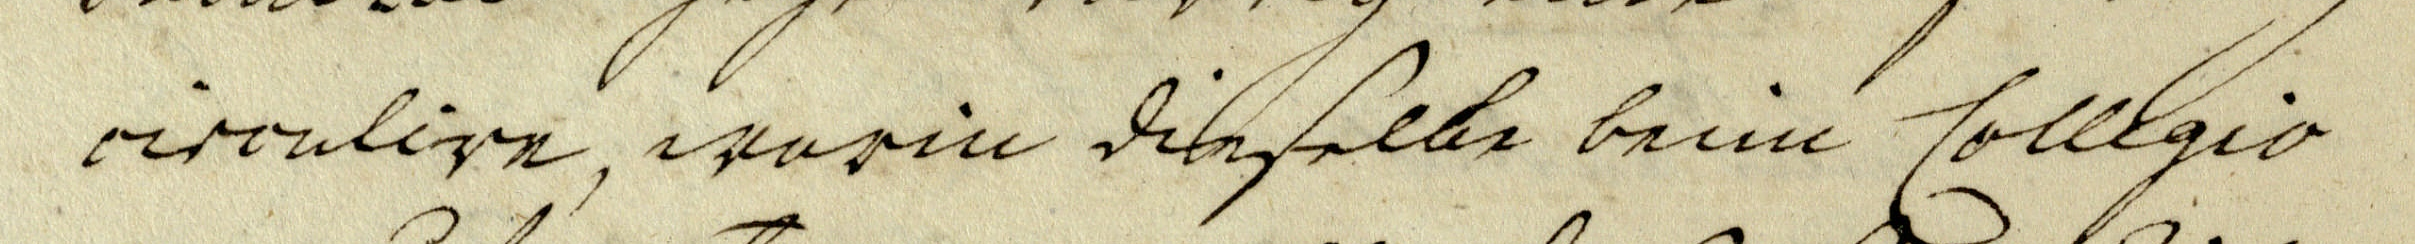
circulire, worin dieselbe beim Collegio
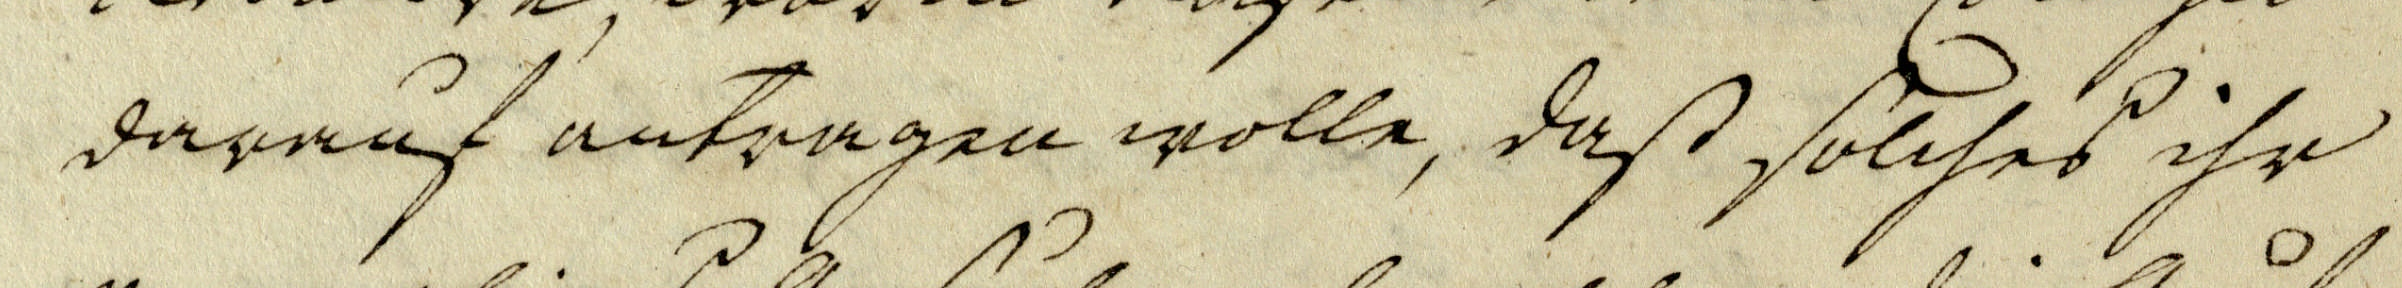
darauf antragen wolle, daß solches ihr
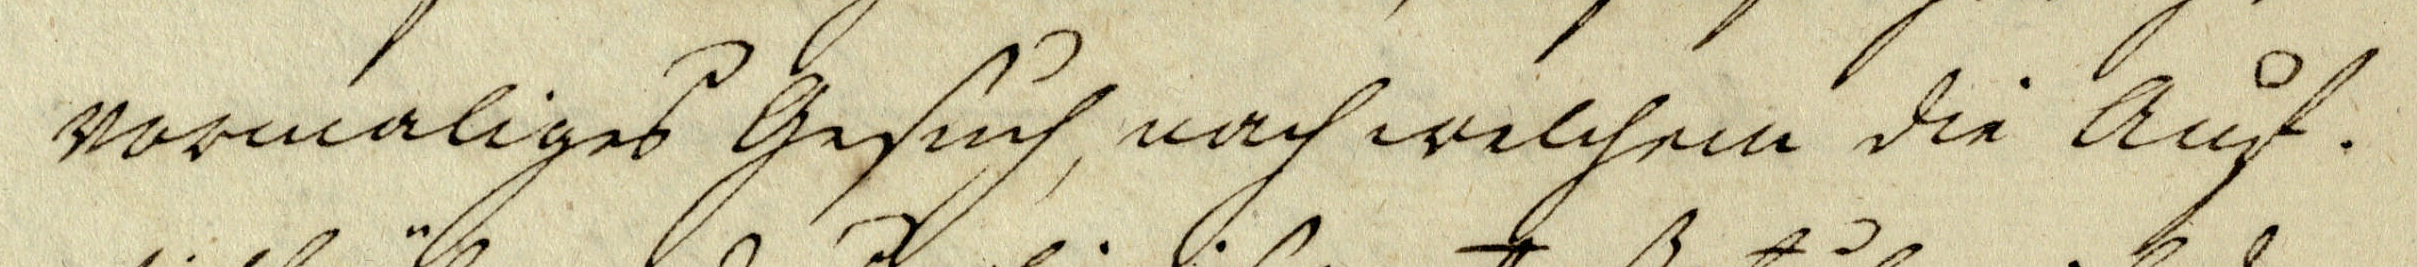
vormaliges Gesuch, nach welchem die Auf¬
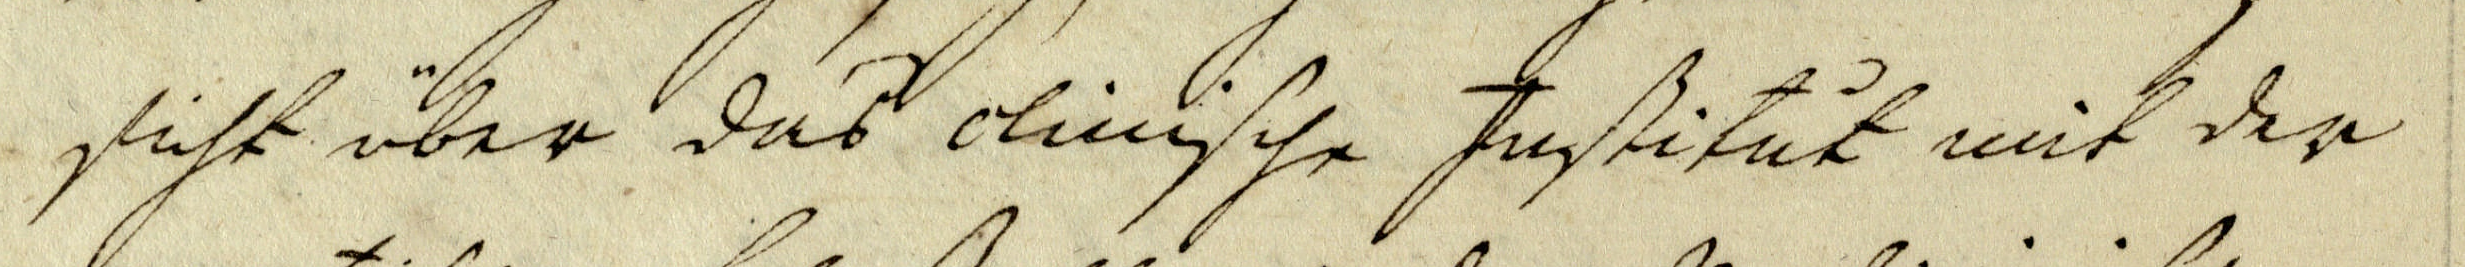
sicht über das clinische Institut mit der
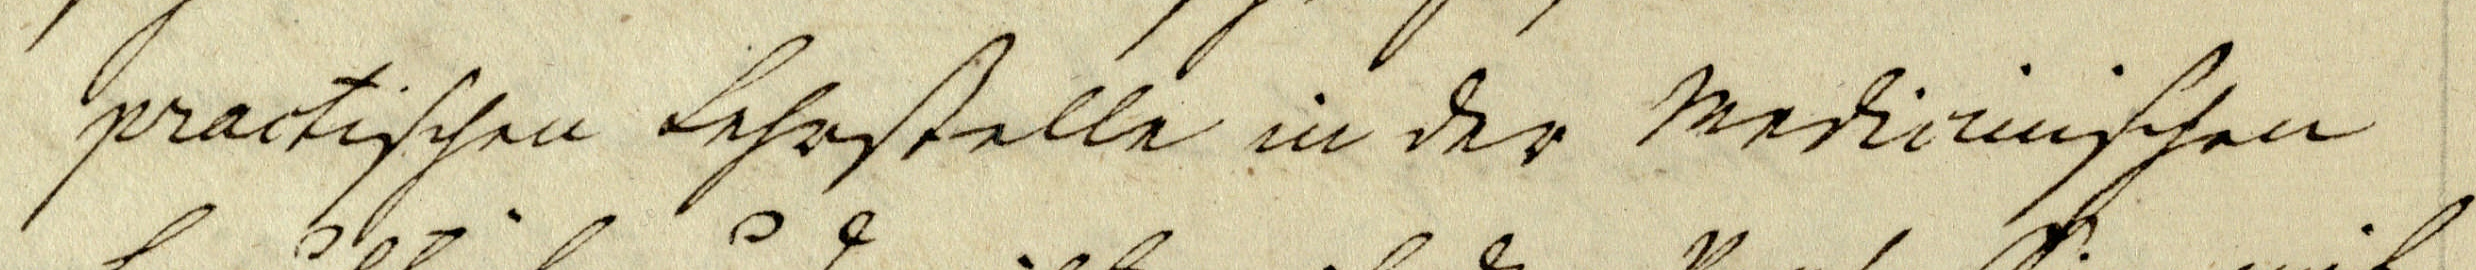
practischen Lehrstelle in der Medicinischen
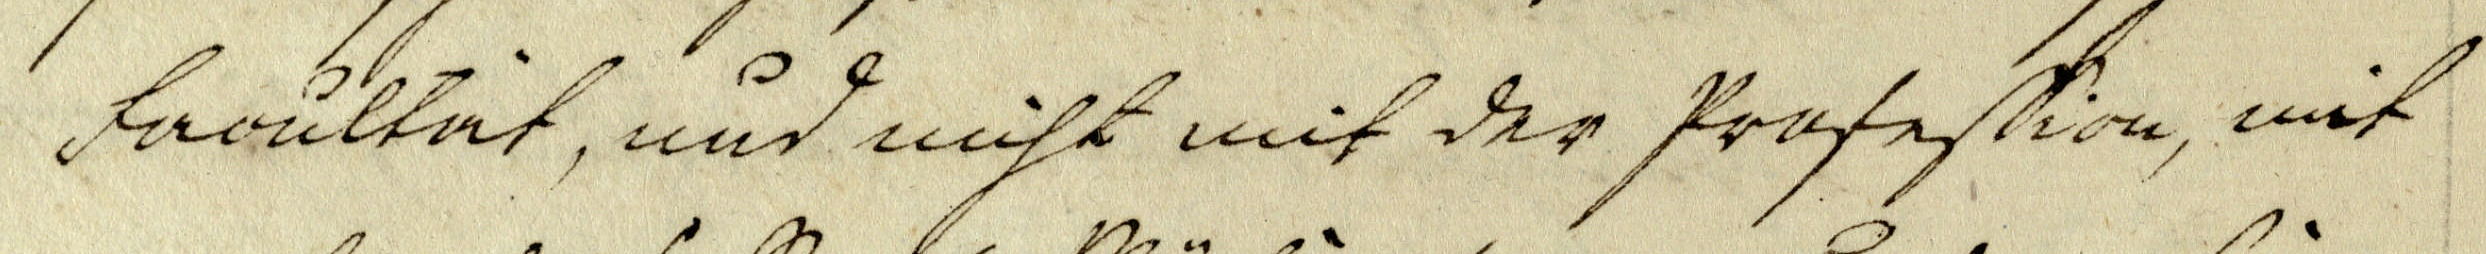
Facultät, und nicht mit der Profession, mit
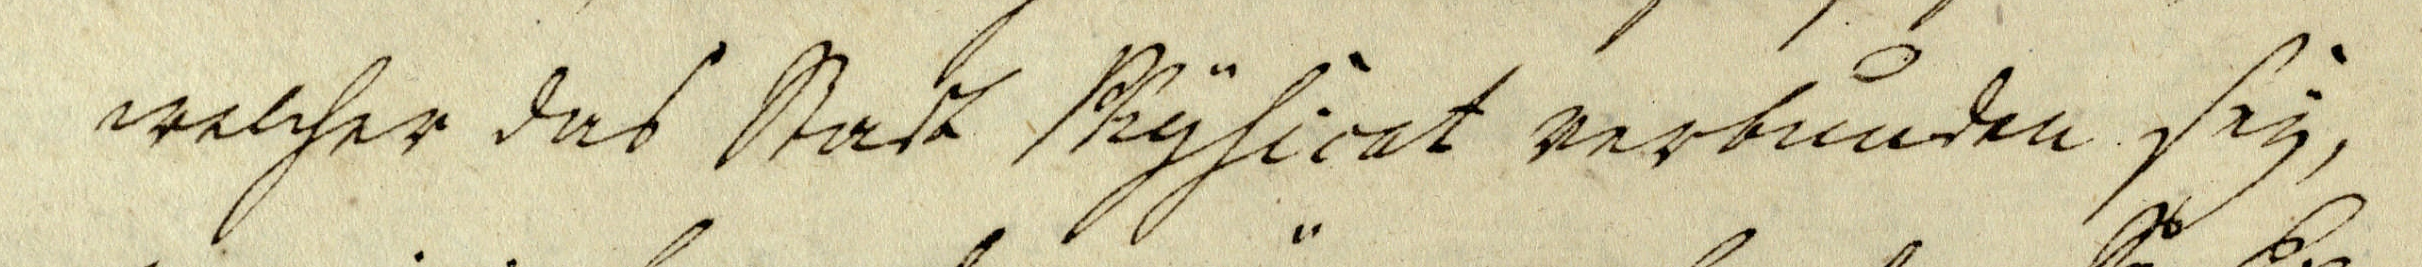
welcher das Stadt Phÿsicat verbunden seÿ,
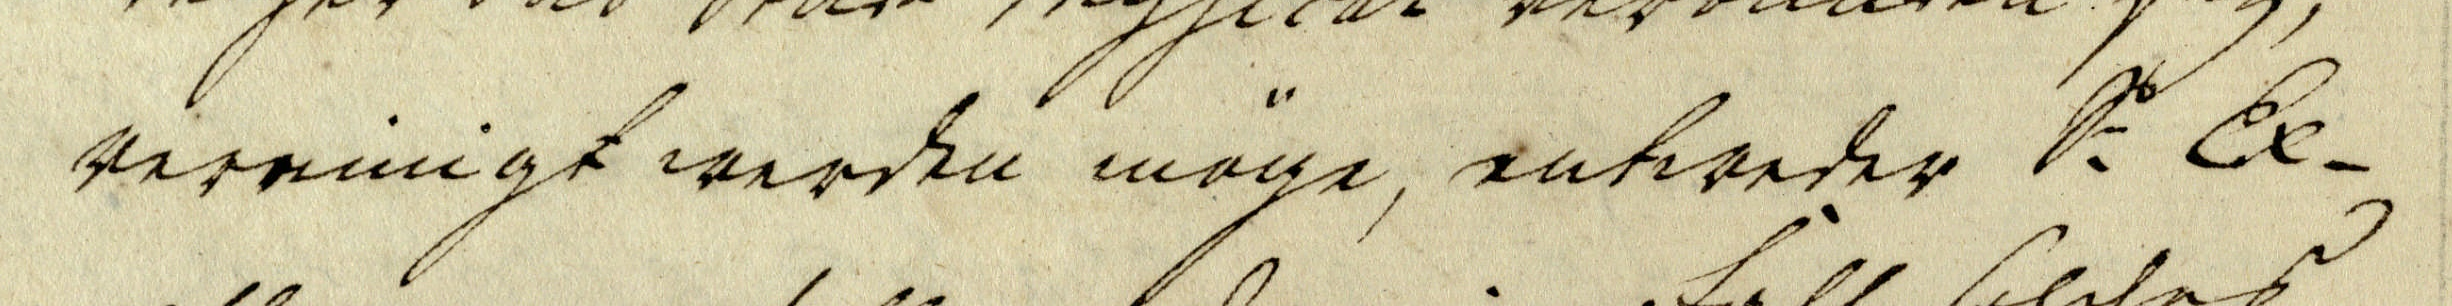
vereinigt werden möge, entweder Sr Ex¬
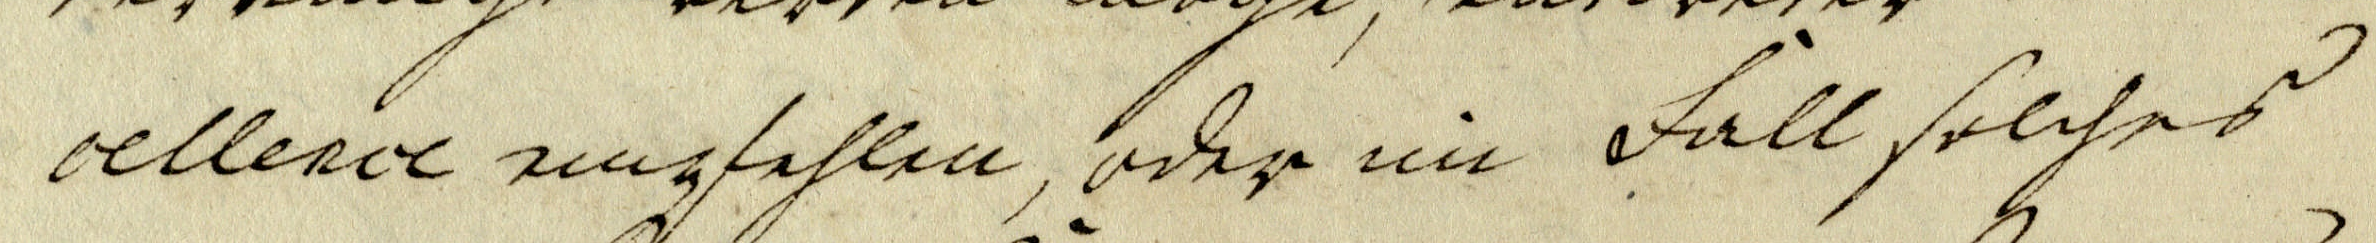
cellence empfehlen, oder im Fall solches
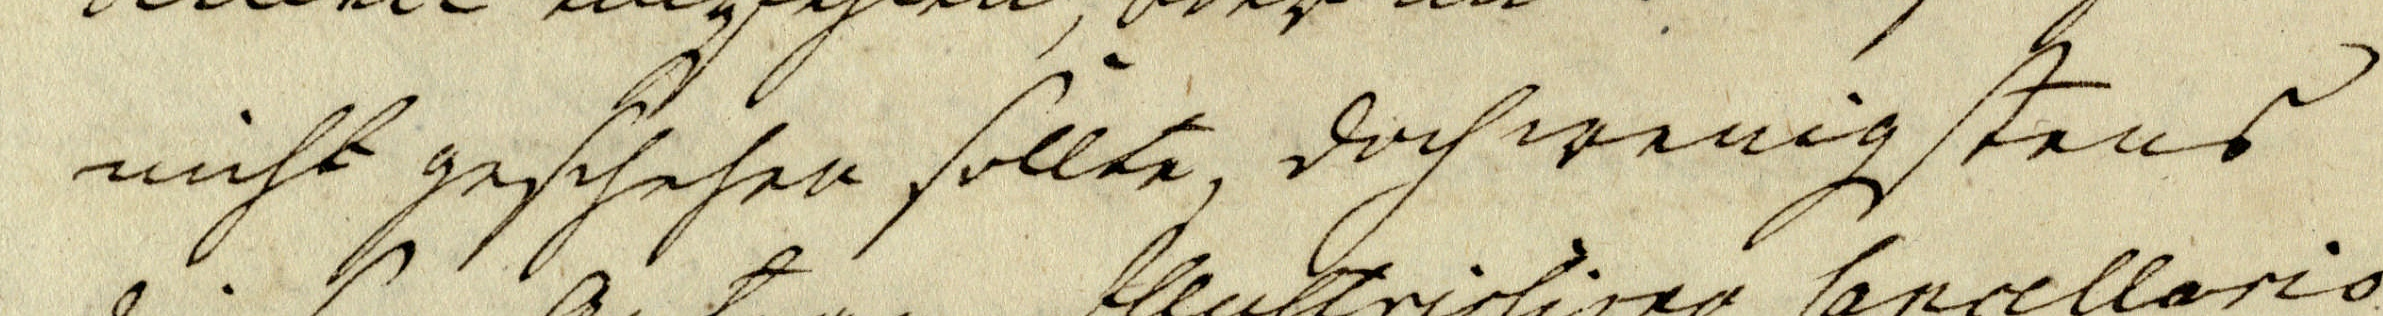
nicht geschehen sollte, doch wenigstens
